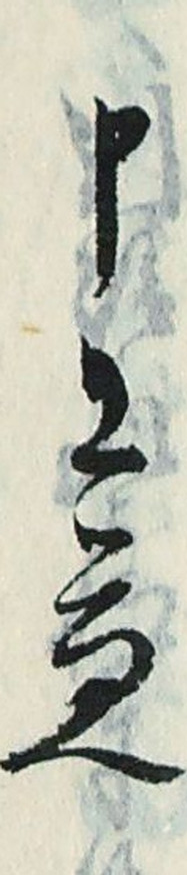申上覚
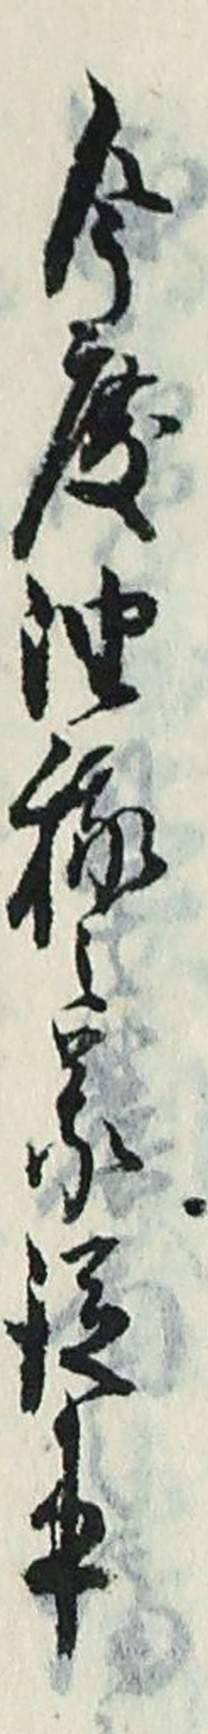今度油稼之義従来
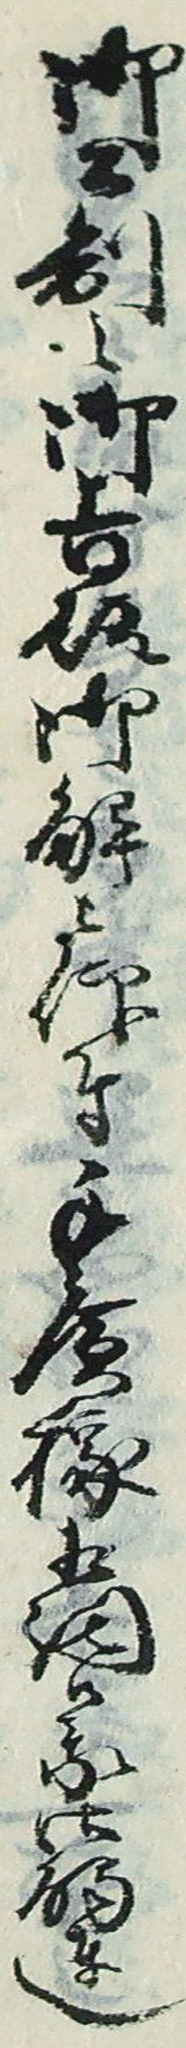御公制之御旨趣御解被仰付手広稼相調候義御触達
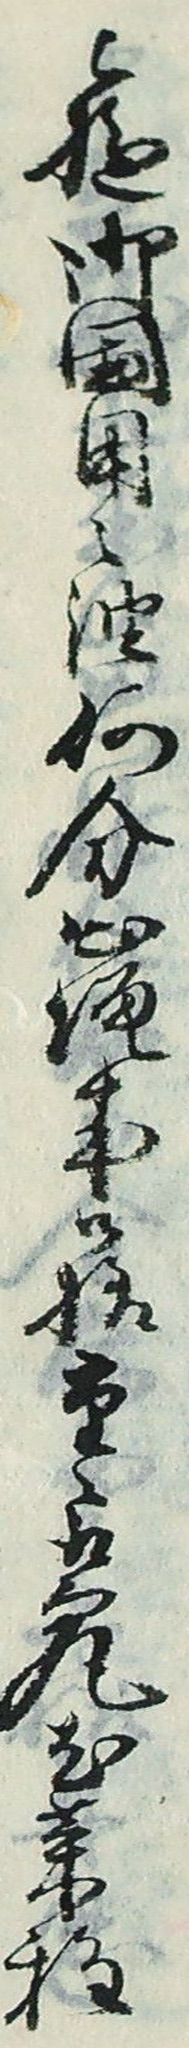被遊御国用之油何分出増成候様重々取究尤菜種
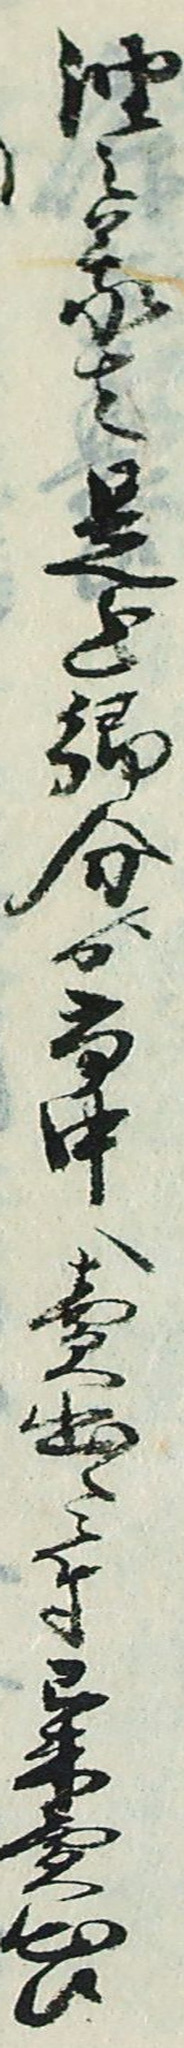油之義者是迄郷分ゟ市中へ売出候に付已来売出候
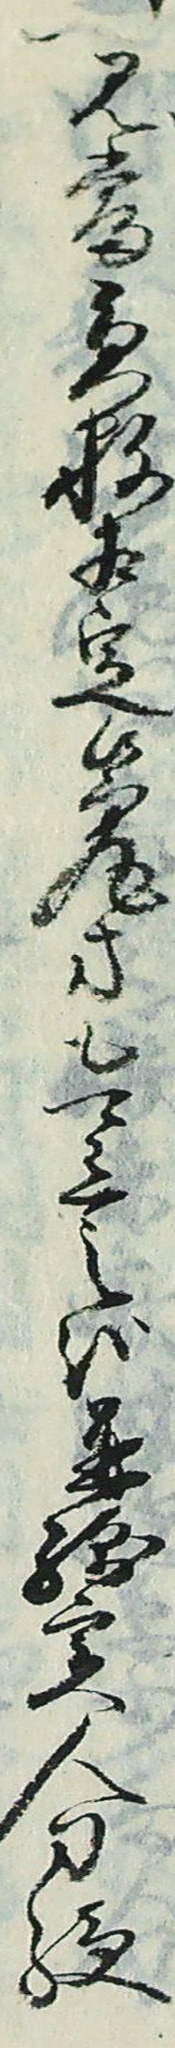見当員数相定候究方も可有之哉幷綿実人力絞
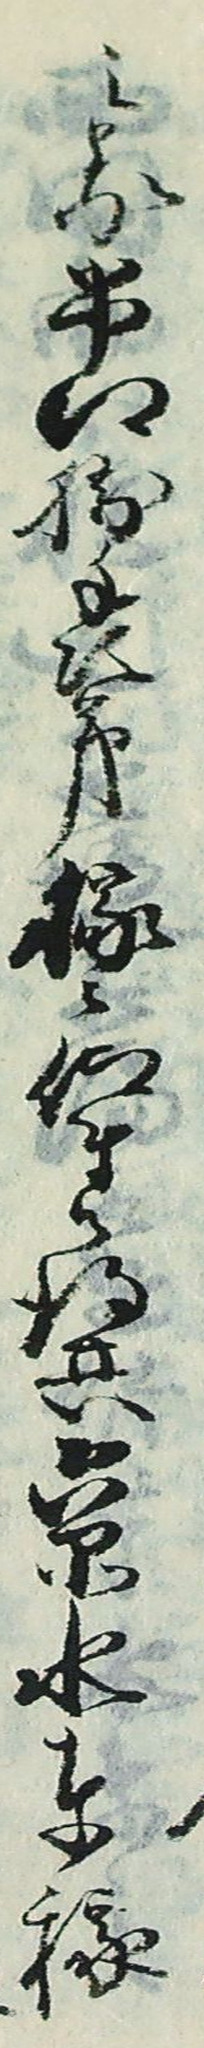之義市郷勝手次第稼被仰付候得共右品水車稼者
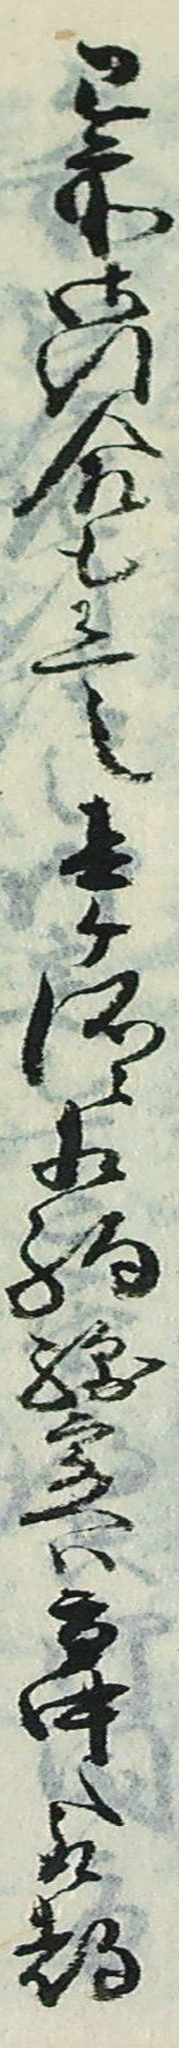已前御引合も有之壱ケ所に相約綿実は市中へ取都
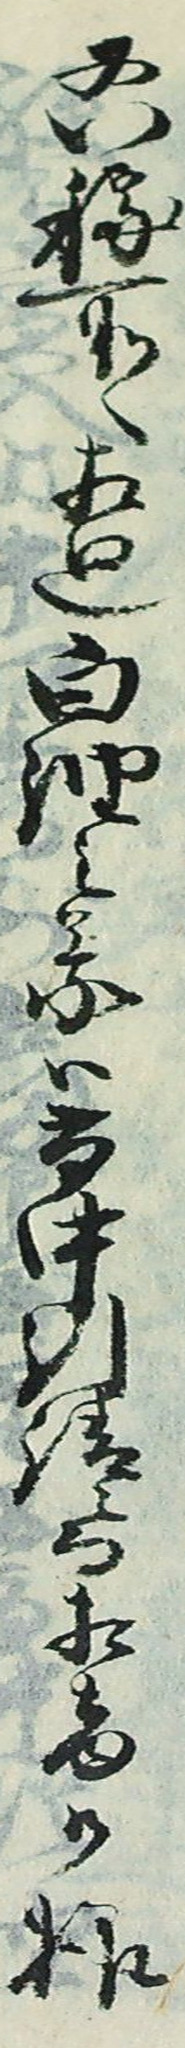右稼所へ相廻白油之義は市中引請に而相商候様
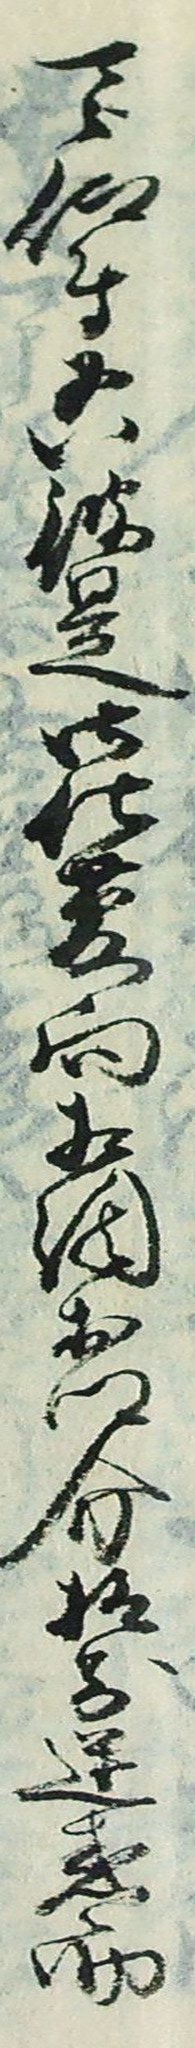可被仰付右彼是御仕菅向相調於郷分格別迷惑筋
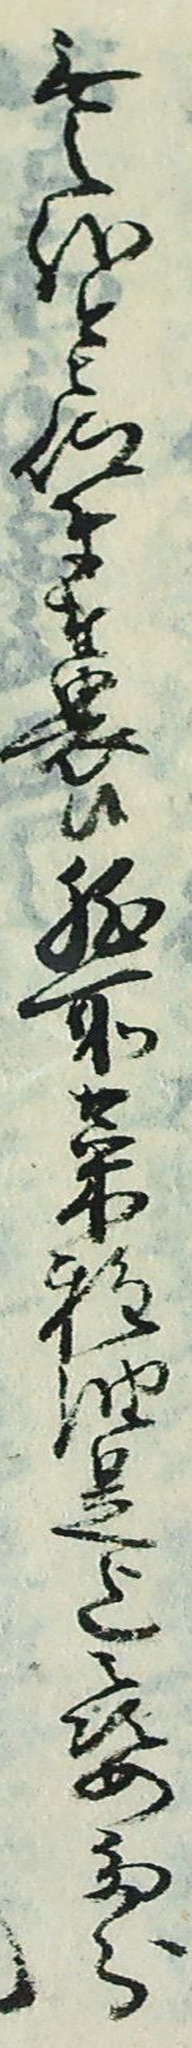無之哉と被仰付奉畏候然処菜種油是迄之姿多分
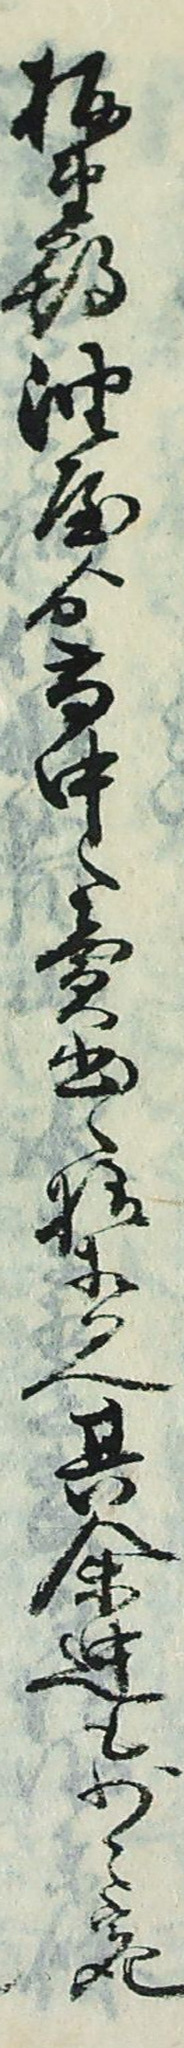板野郡油屋ゟ市中へ売出候様相見其余迚も少々宛
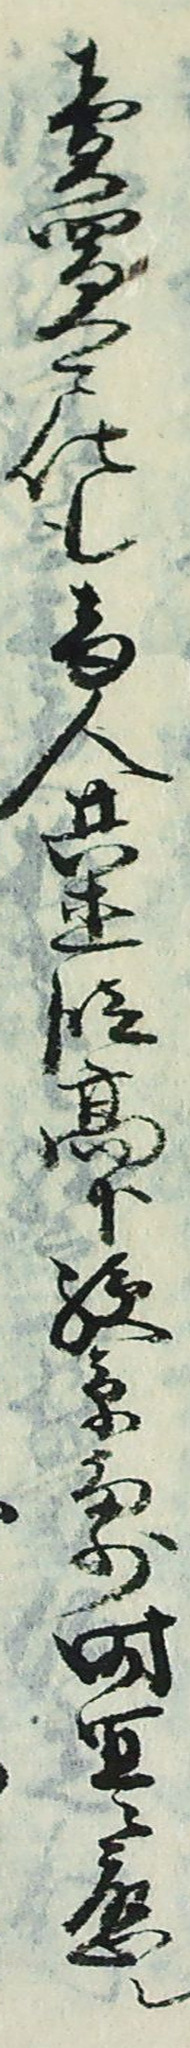売買可仕も商人共直段高下絞草多少時宜に応し
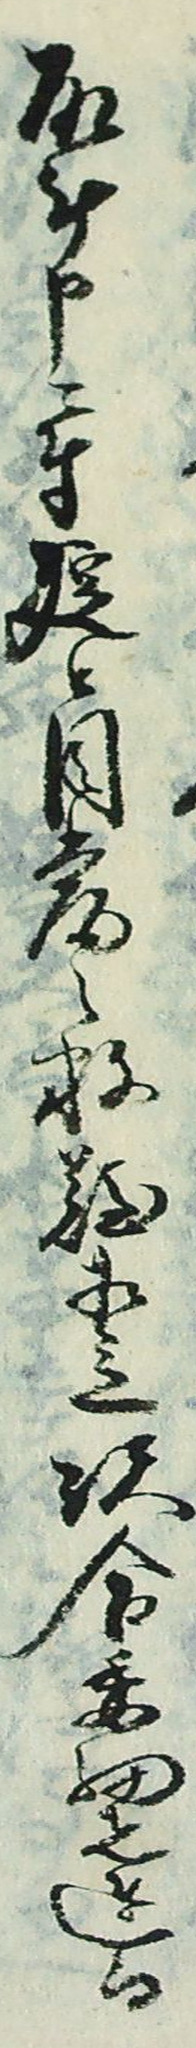取計申に付聢と目当之数難相立訳合委細先達而
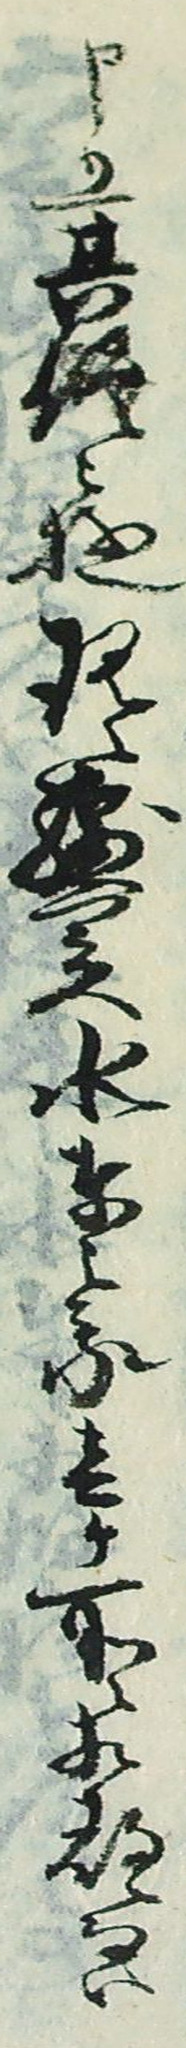申上其侭被遊現に綿実水車之義壱ケ所に相都候而は
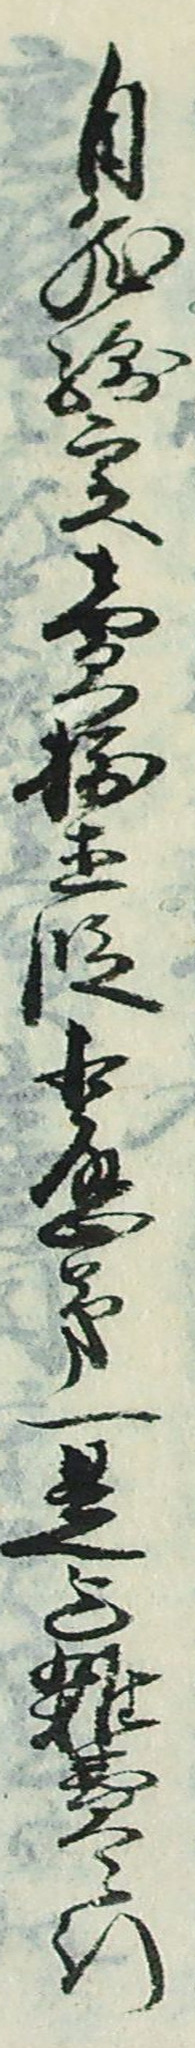自然綿実売捌直段相応第一是迄雑費に引
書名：油稼御取究ニ附御箇條書テ以被仰渡南北同役申談御答書控
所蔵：鳴門教育大学 Naruto University of Education
